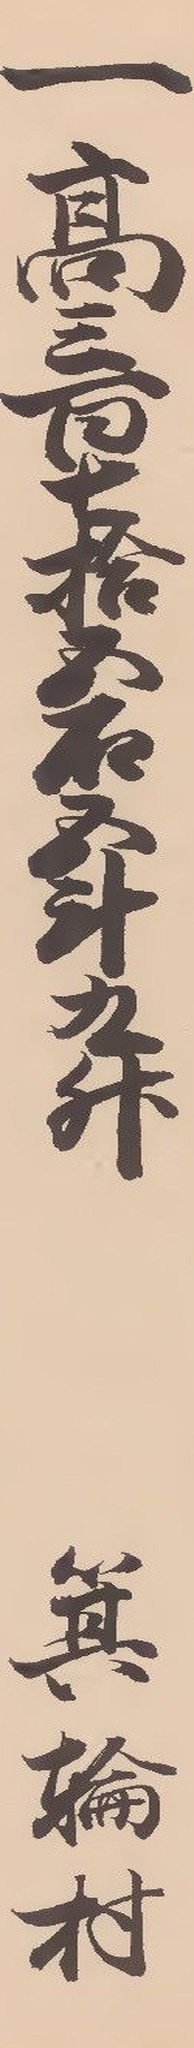一高三百七拾五石五斗九升箕輪村
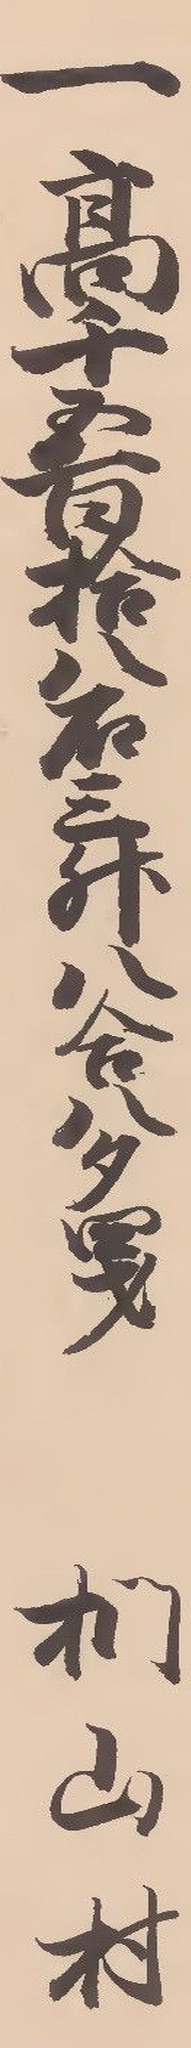一高千五百拾八石三升八合八勺四才椚山村
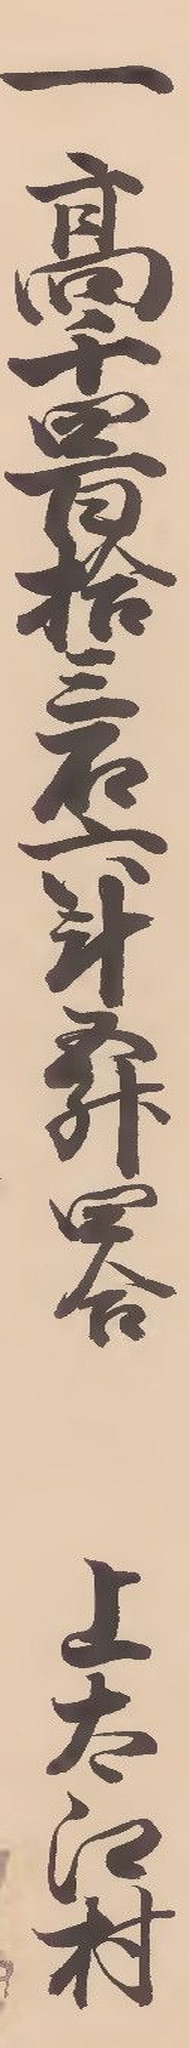一高千四百拾三石六斗五升四合上太江村

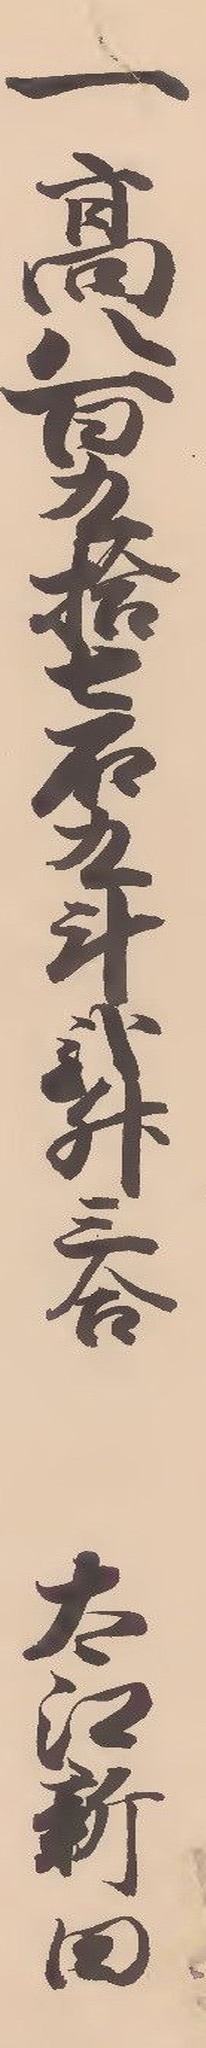一高八百九拾七石九斗弐升三合太江新田
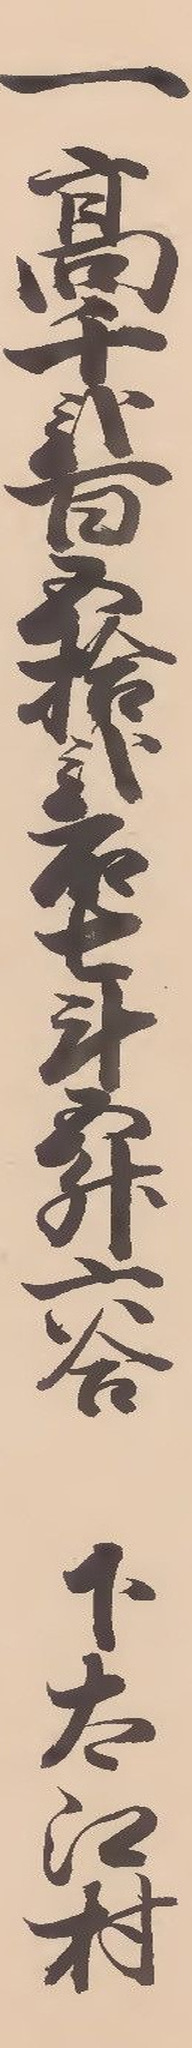一高千弐百五拾弐石七斗五升六合下太江村
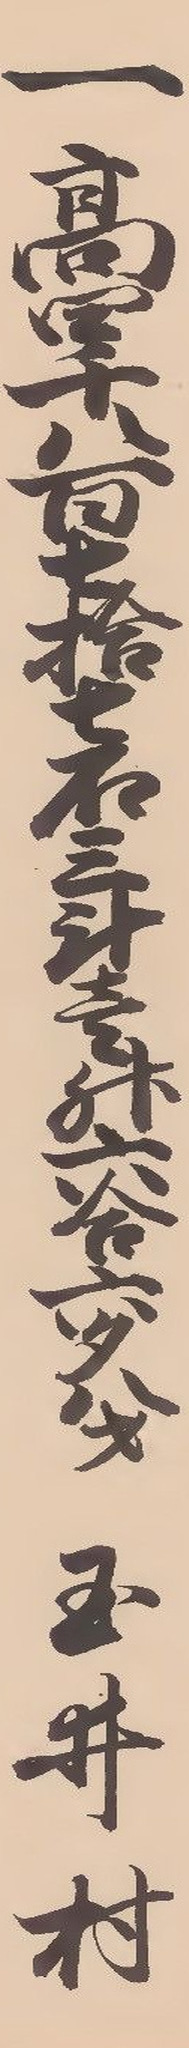一高四千八百七拾七石三斗壱升六合六勺八才玉井村
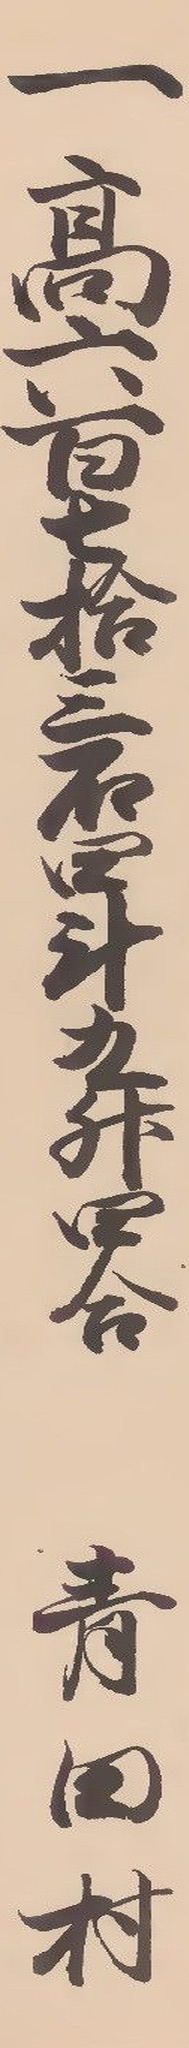一高六百七拾三石四斗九升四合青田村
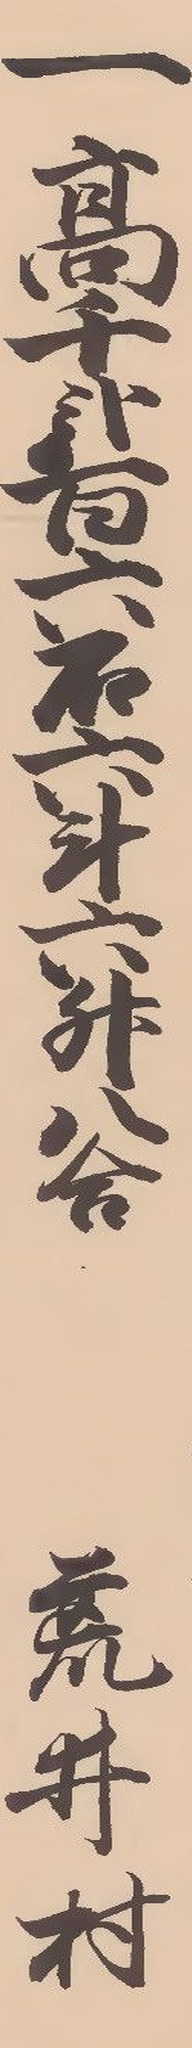一高千弐百六石六斗六升八合荒井村
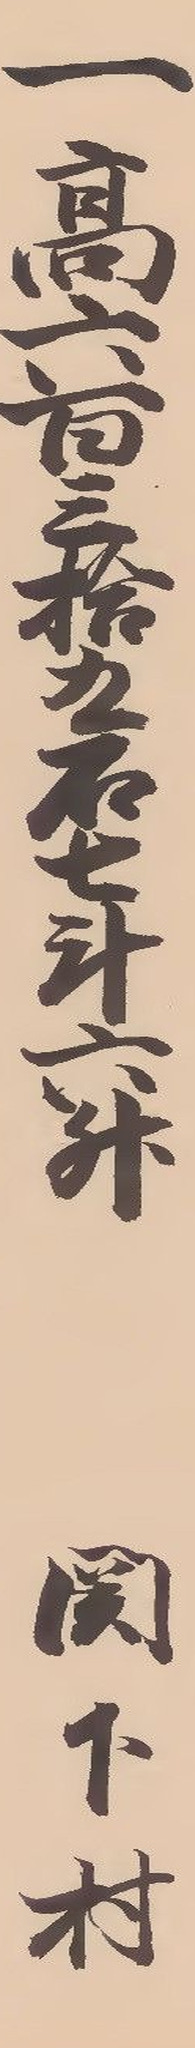一高六百三拾九石七斗六升関下村
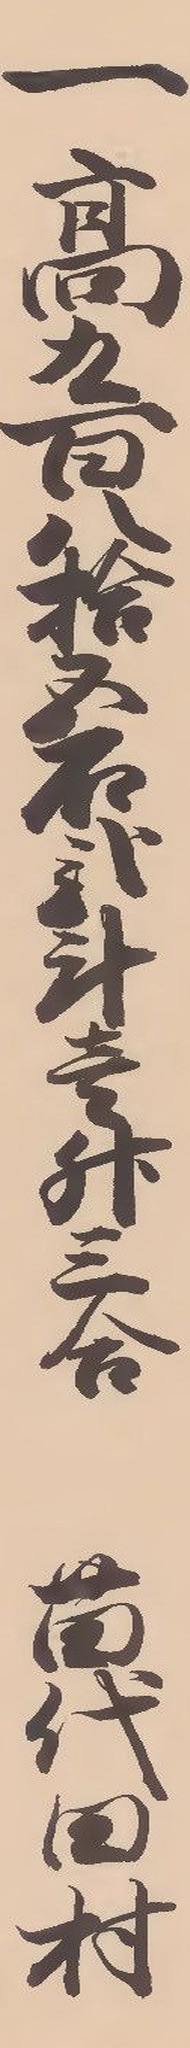一高九百八拾五石弐斗壱升三合苗代田村
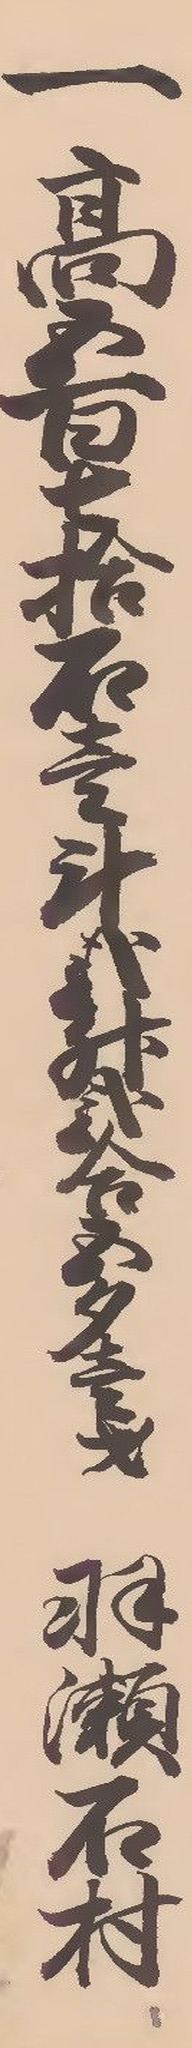一高五百七拾石壱斗弐升弐合五勺壱才羽瀬石村

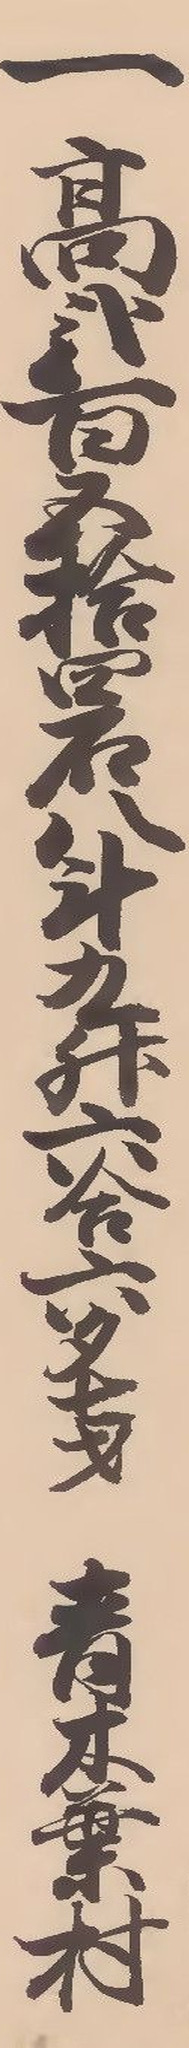一高弐百五拾四石八斗九升六合六勺七才青木葉村
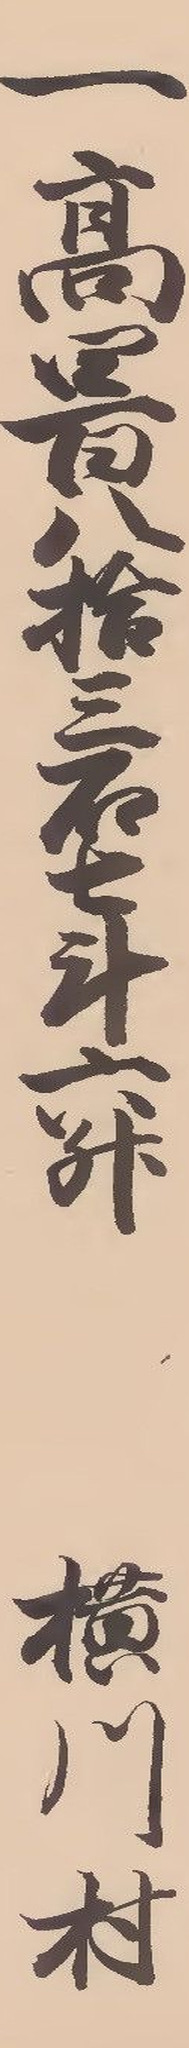一高四百八拾三石七斗六升横川村
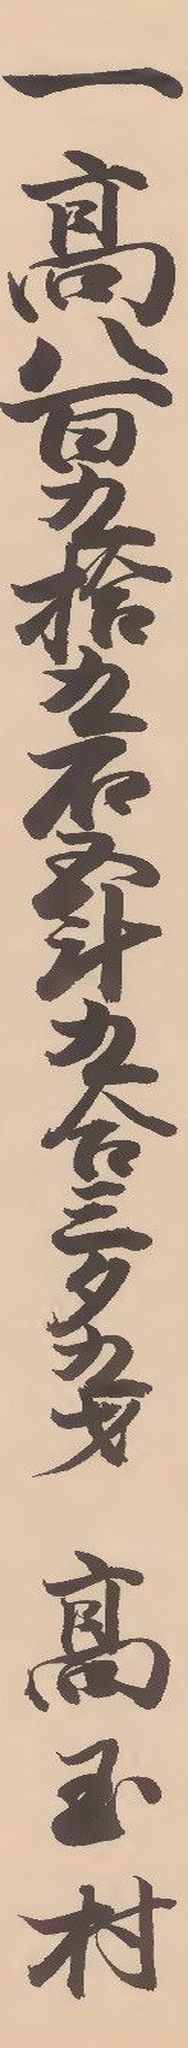一高八百九拾九石五斗九合三勺九才高玉村
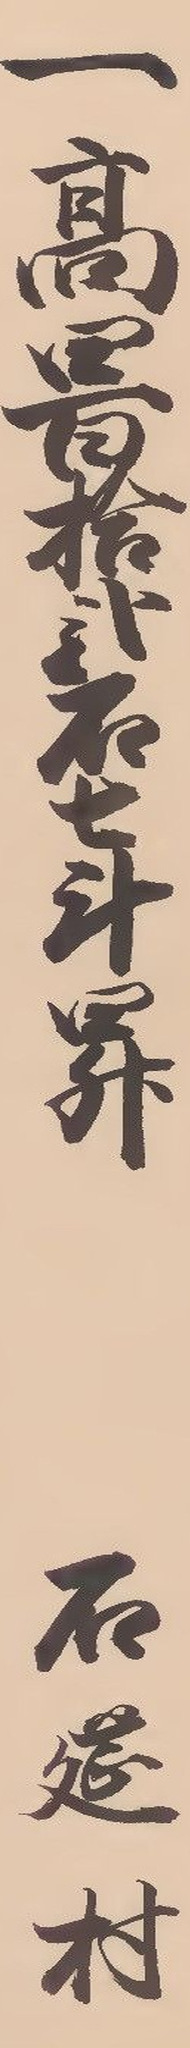一高四百拾弐石七斗四升石莚村
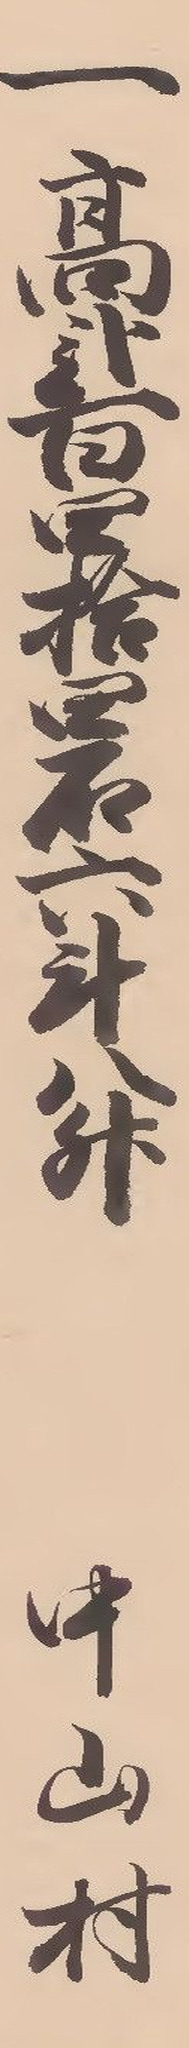一高弐百四拾四石六斗八升中山村
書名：陸奥国郷帳　２
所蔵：国立公文書館 National Archives of Japan
